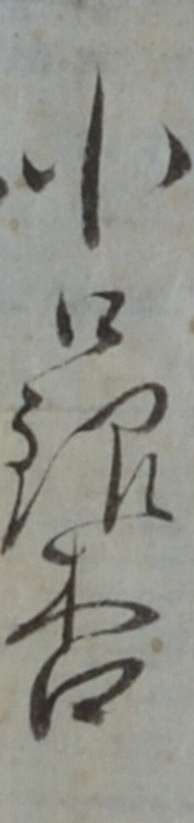小口銀杏
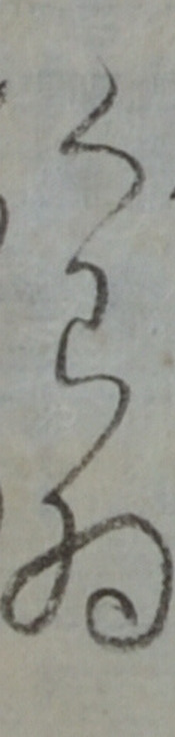くわゐ
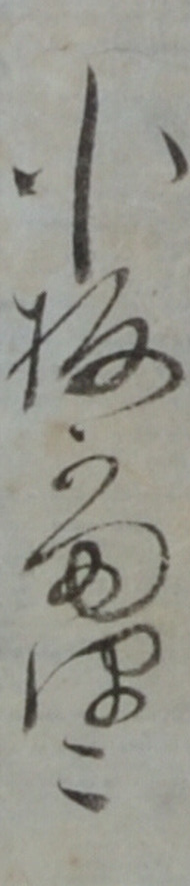小板かまほこ
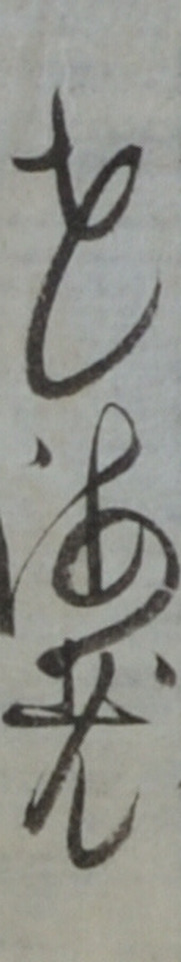花海老
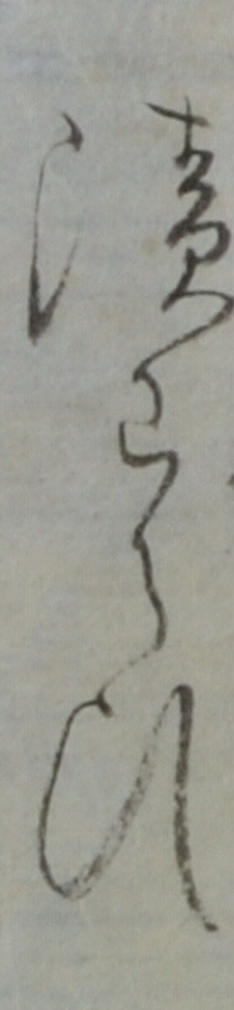漬わらひ
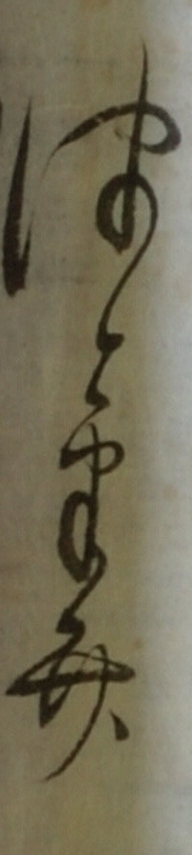つと半弁

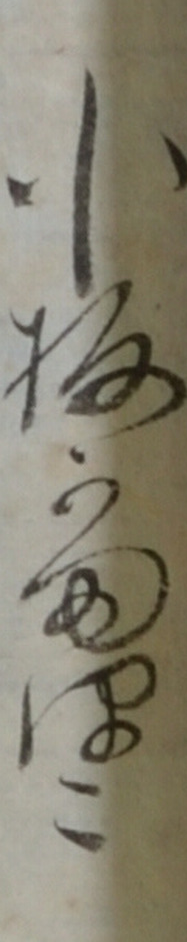小板かまほこ
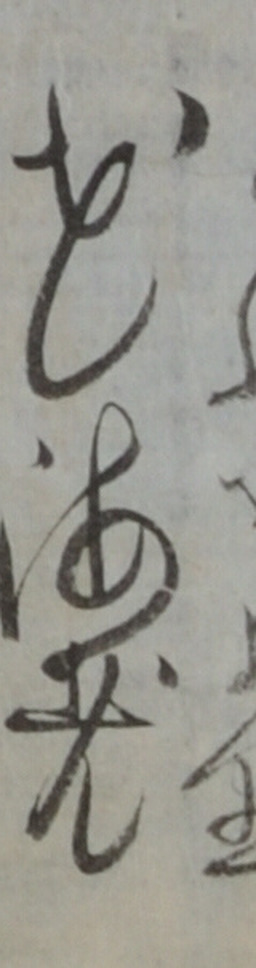花海老
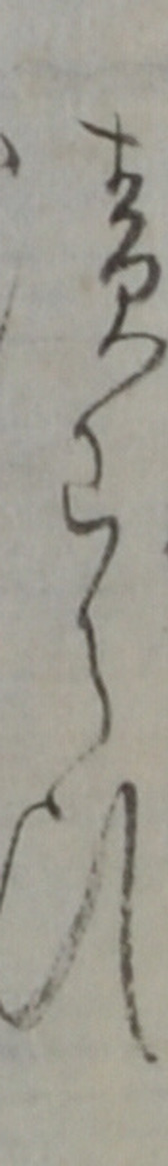漬わらひ
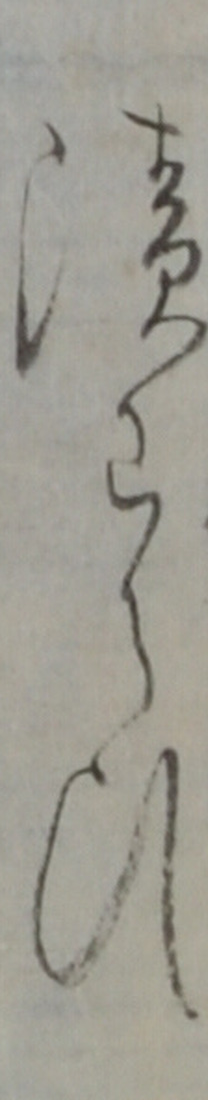漬わらひ
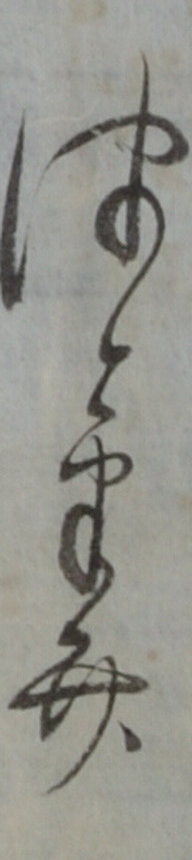つと半弁
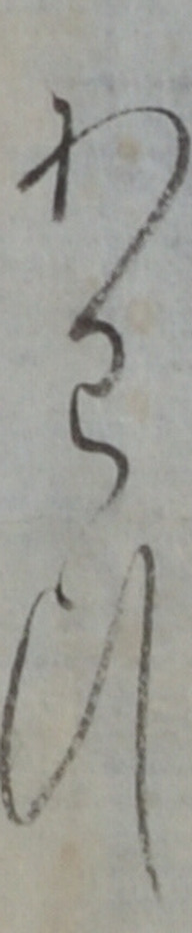わらひ
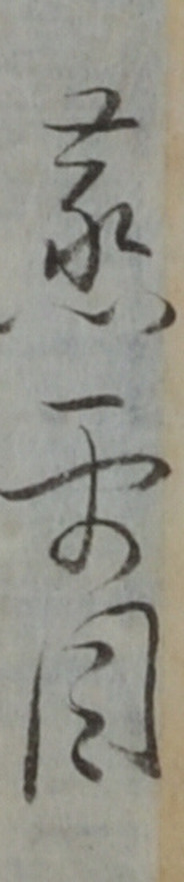蒸平目
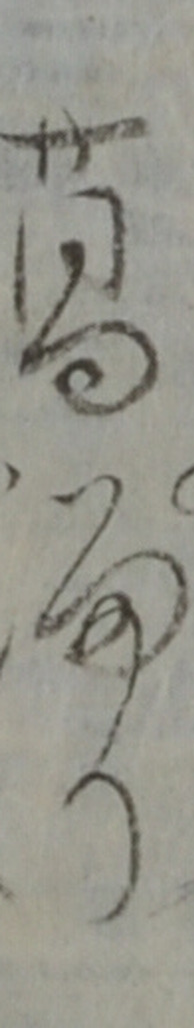葛溜り
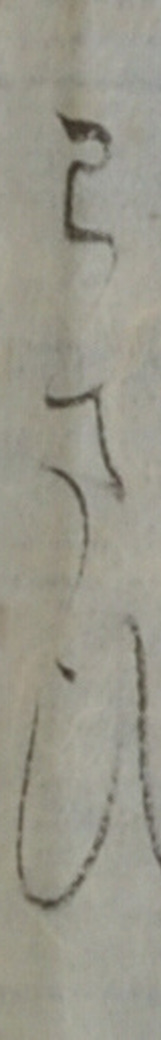わさひ
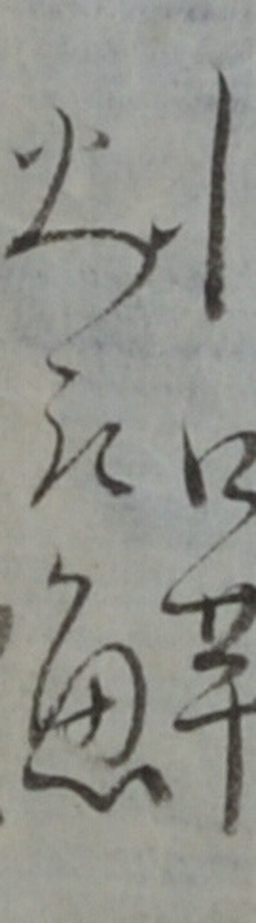火取魚
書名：献立書上
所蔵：伊那市立高遠町図書館・合同会社AMANE
